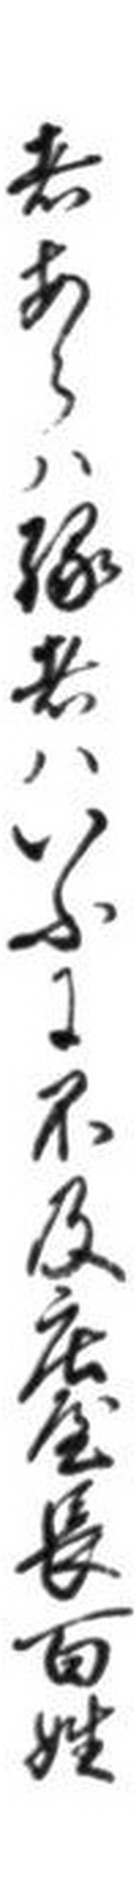者あらは縁者はいふに不及庄屋長百姓
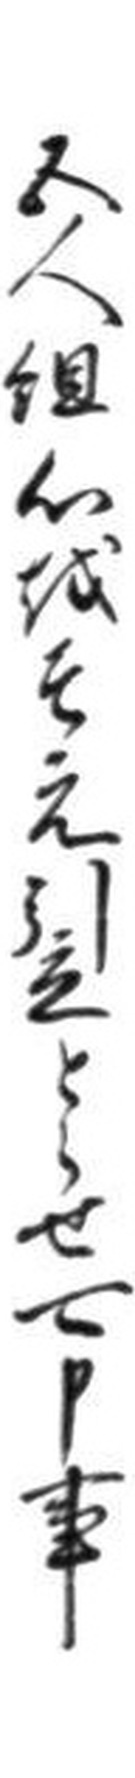五人組心をそえ引立とらせ可申事
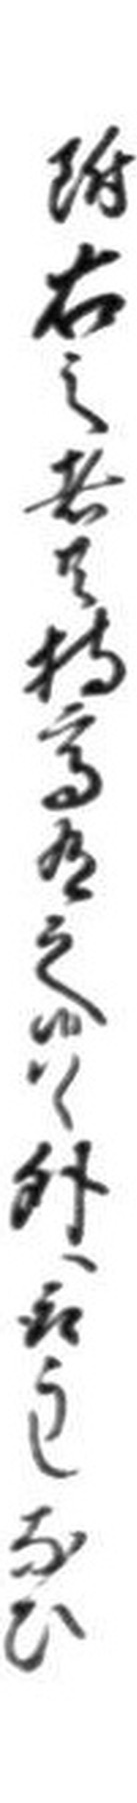附右之者共持高有之候はゝ外へ取うしなひ
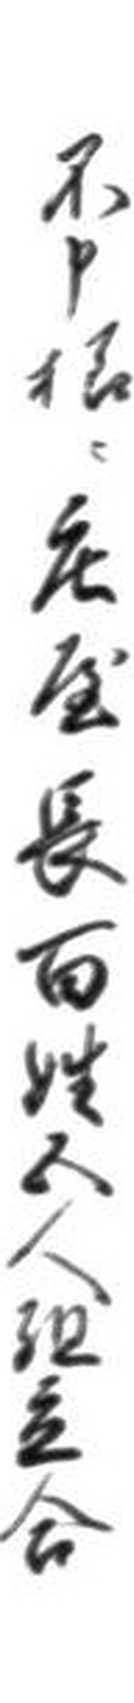不申様に庄屋長百姓五人組立合
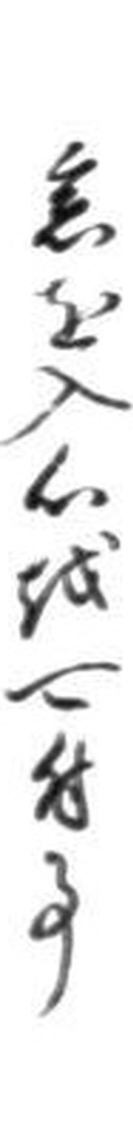意を入心を可付事
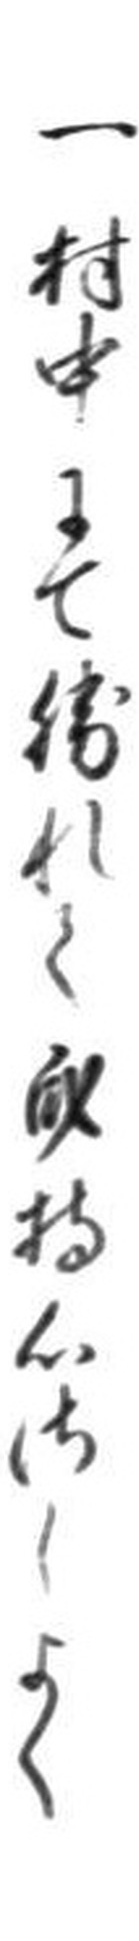一村中にて勝れて身持心さしよく
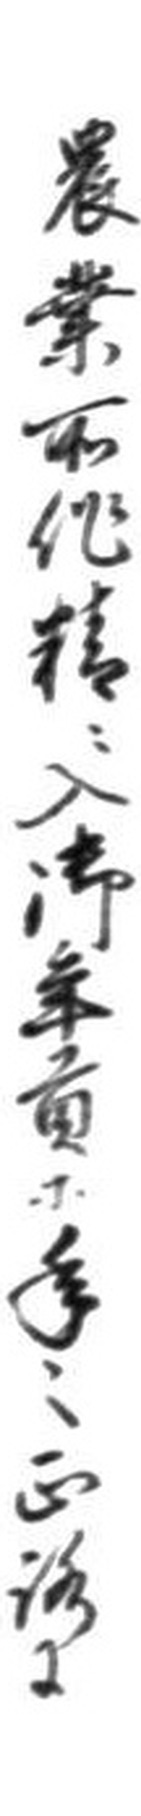農業所作精に入御年貢等て手に正路に
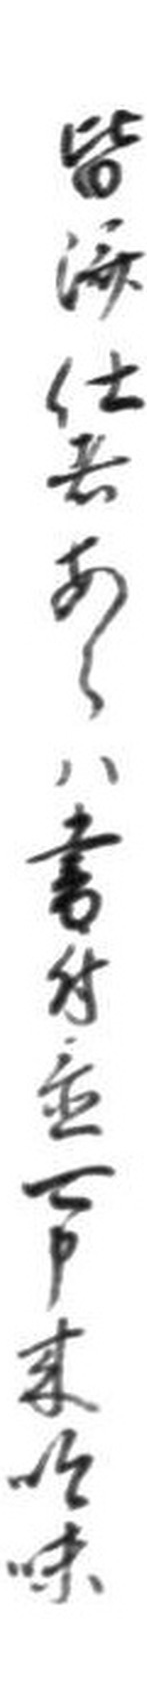皆済仕者あらは書付置可申来吟味
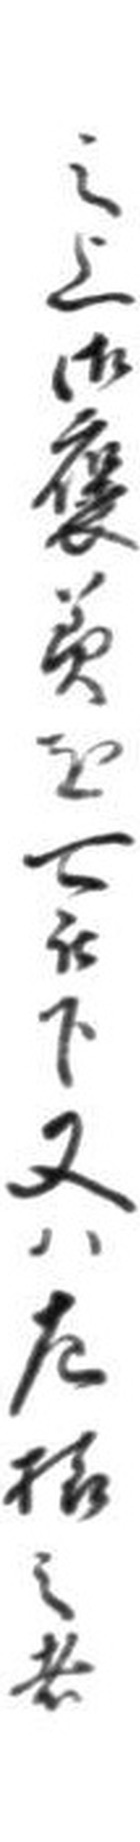之上御褒美を可被下又は左様之者
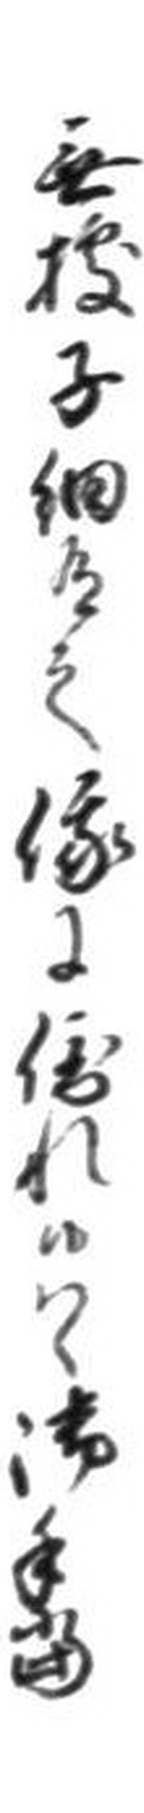無拠子細有之俄に倒れ候はゝ御手当
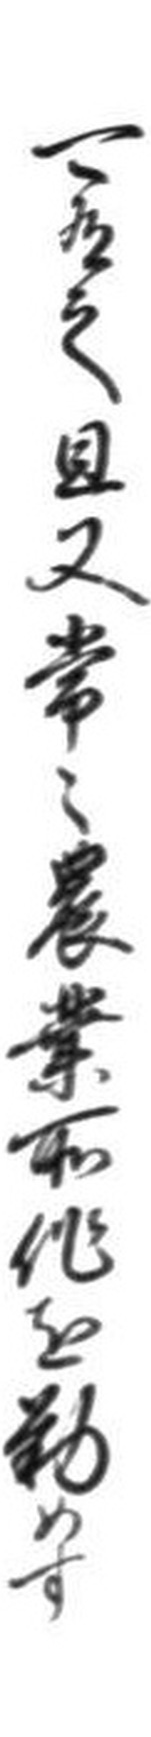可有之且又常々農業所作を勤めす

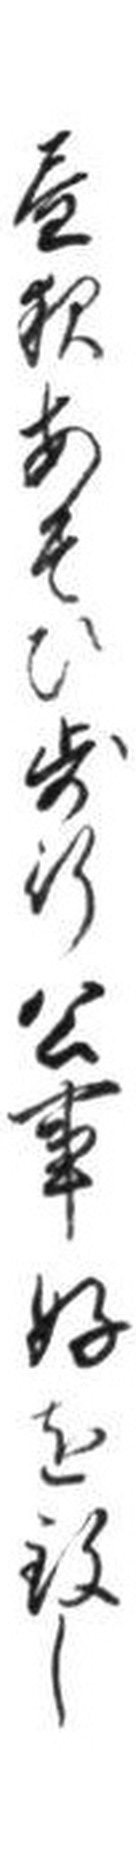昼夜あそび歩行公事好を致し
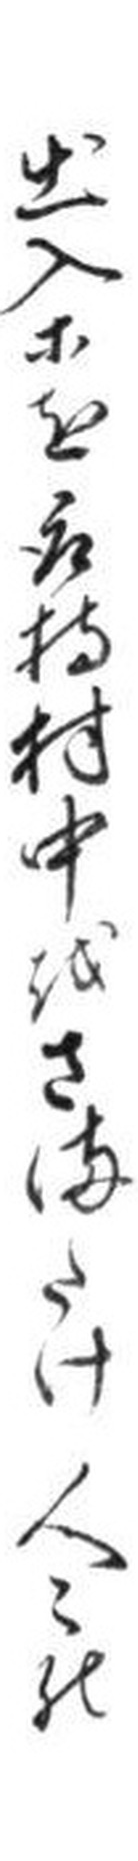出入等を取持村中をさまたけ人々の
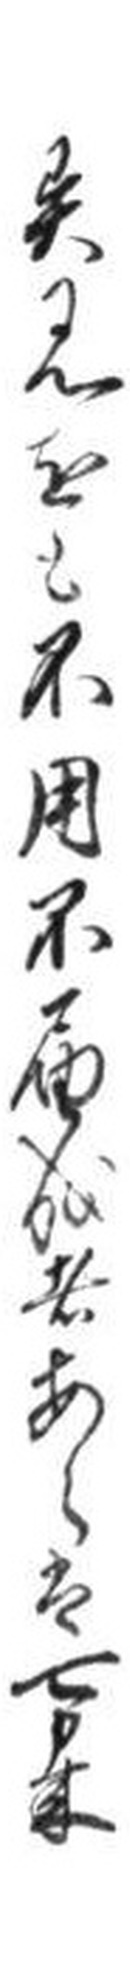異見をも不用不届成者あらは可申来
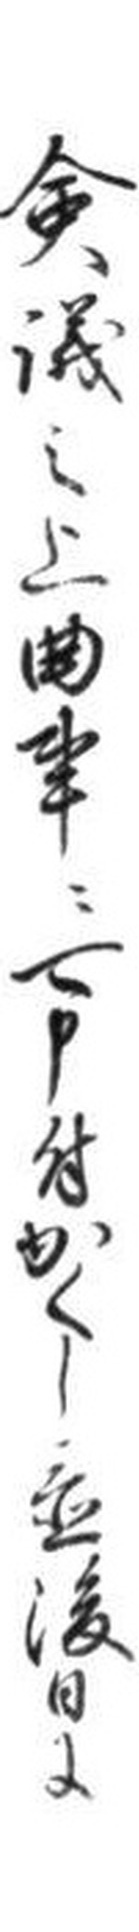僉議之上曲事に可申付かくし置後日に
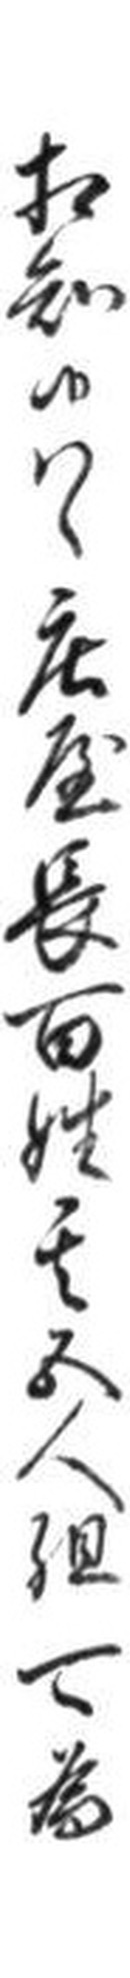相知候はゝ庄屋長百姓其五人組可為
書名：家譜 十六 吉品公 従貞享三年閏三月到同四年
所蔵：福井県文書館 Fukui Prefectural Archives
